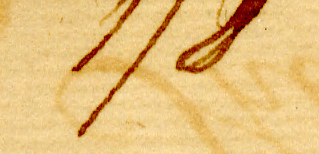1/8
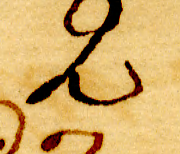2
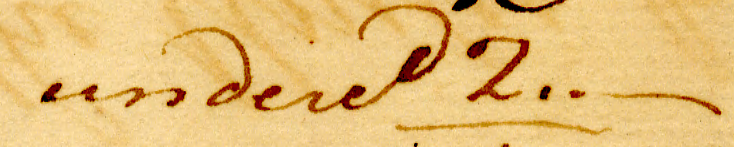undere^d 2.-
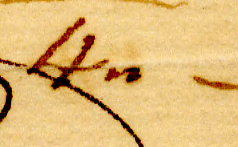4n
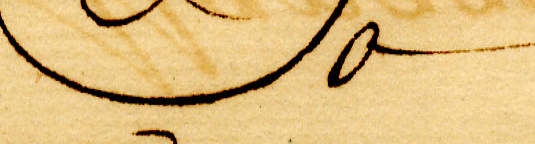To
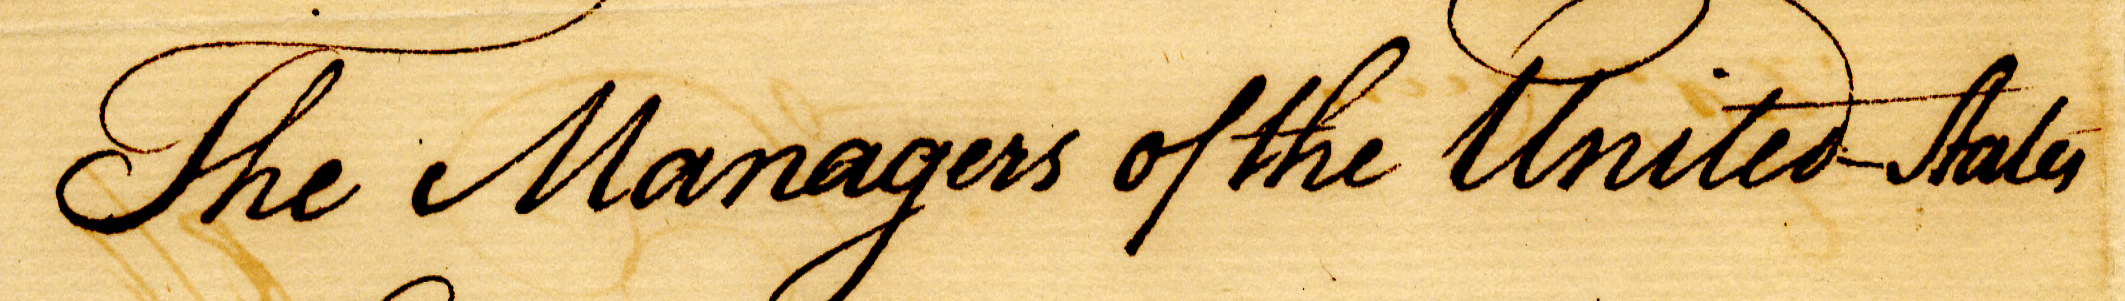The Managers of the United States
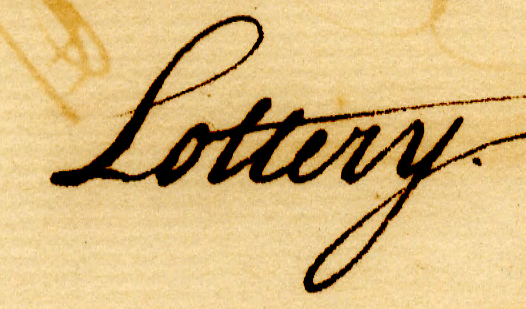Lottery.
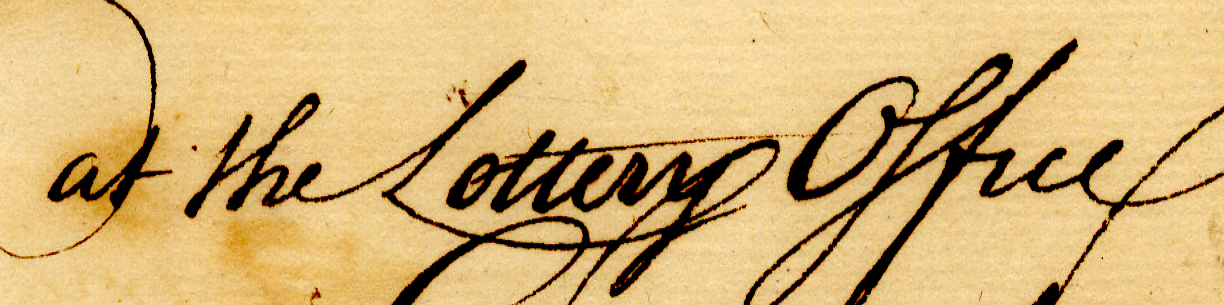at the Lottery Office
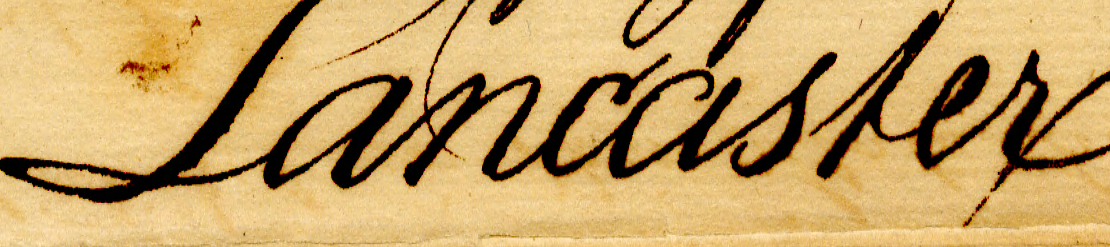Lancaster
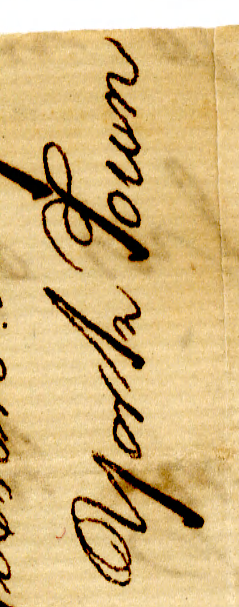York Town
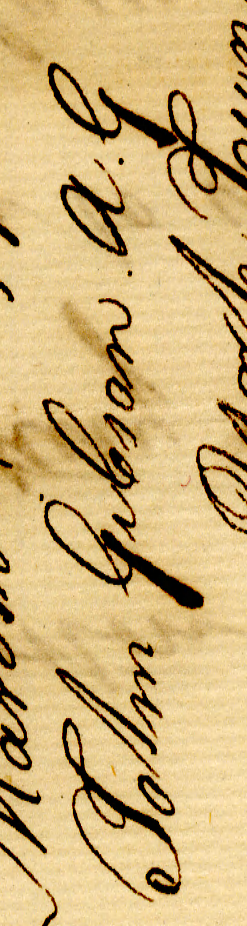John Gibson. A.G
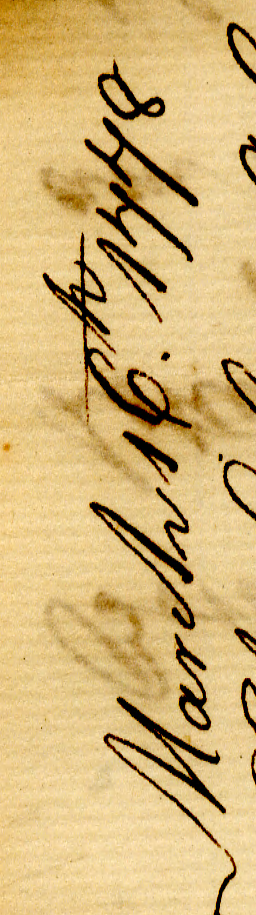March 16.^th 1778
